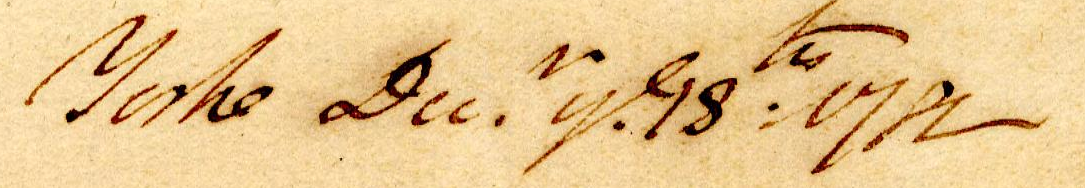Yorke Dec^r. y^e 18^th 1781
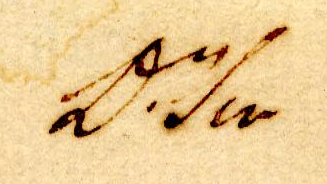D^r. Sir
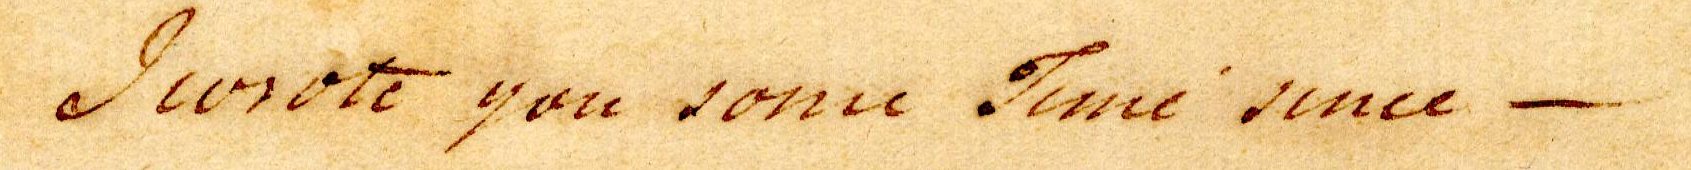I wrote you some Time since
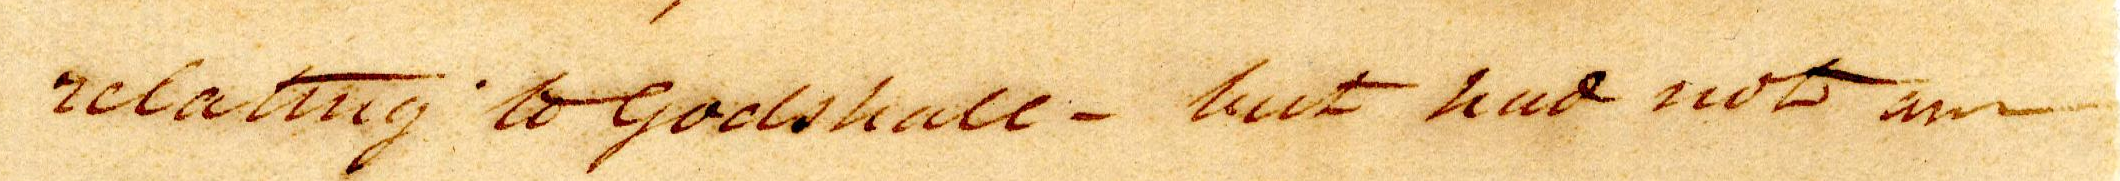relating to Godshall, but had not any
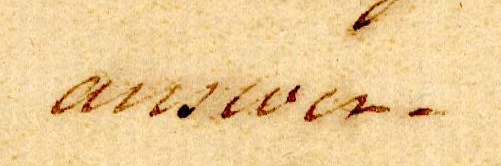answer.
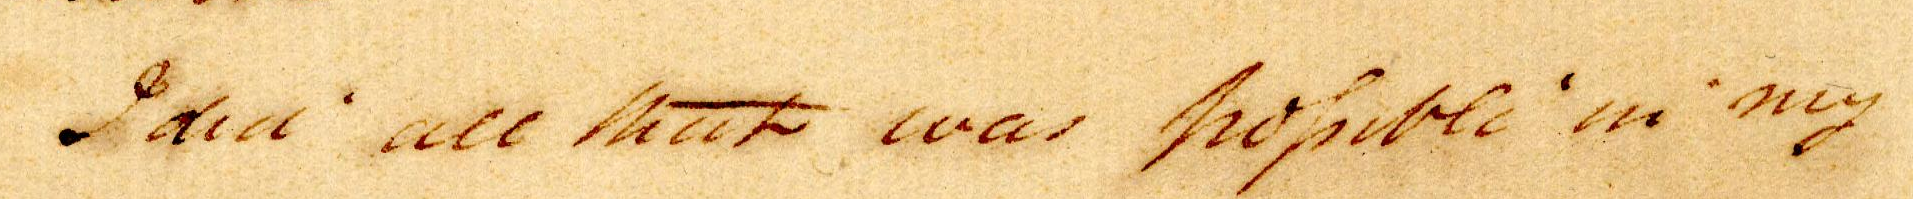I did all that was possible in my
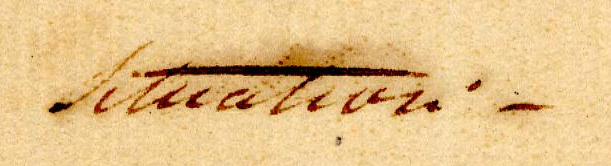Situation.
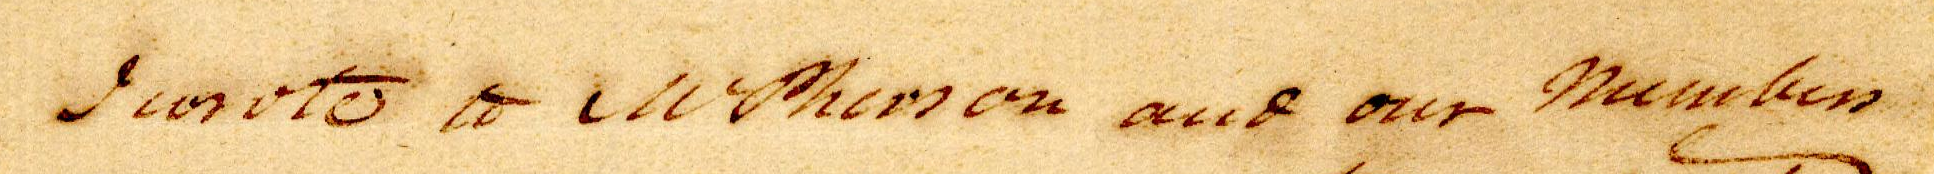I wrote to M^cPherson and our Members
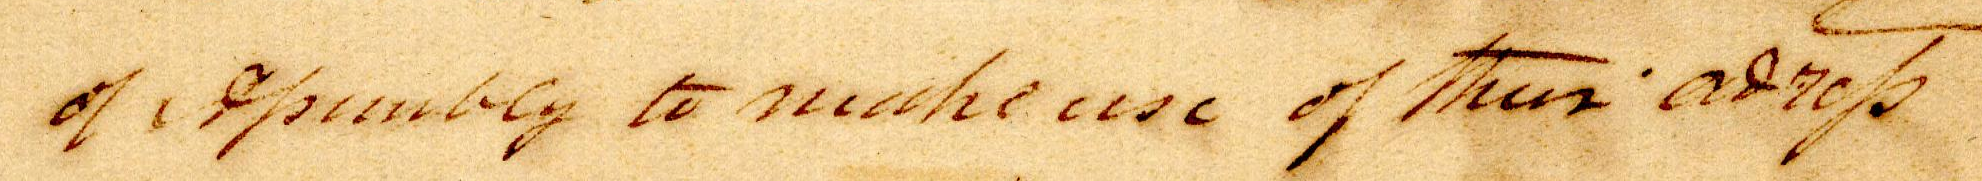of Assembly to make use of their adress
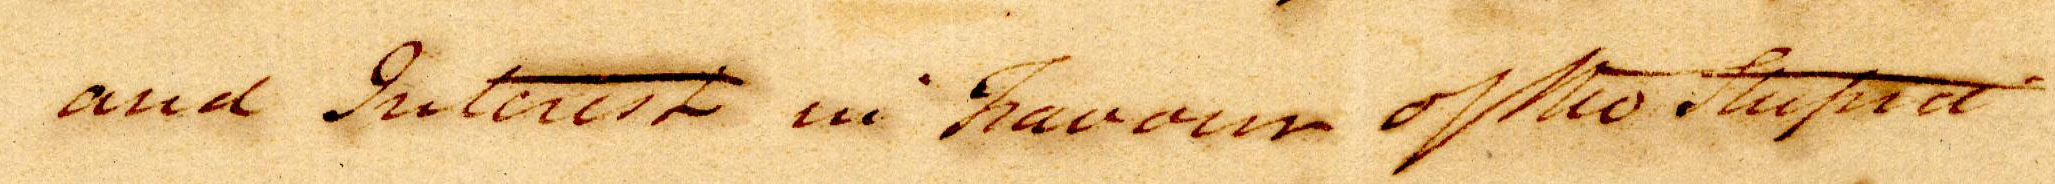and Interest in Favour of the Stupid
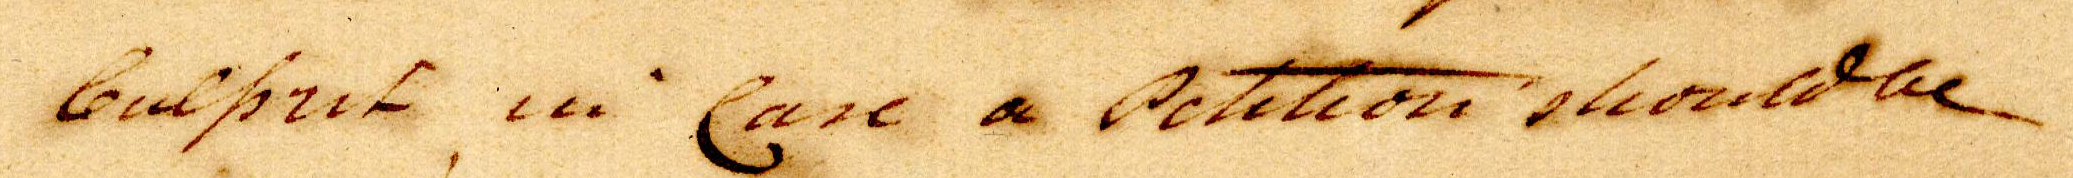Culprit in Case a Petition should be
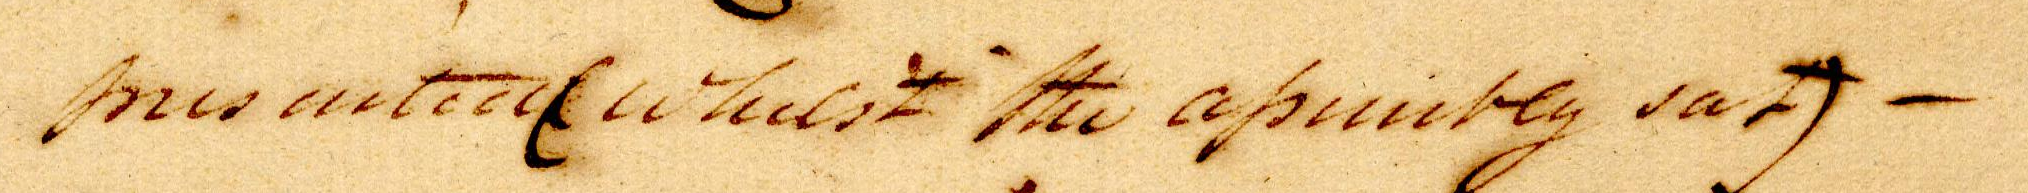presented (whilst the assembly sat)
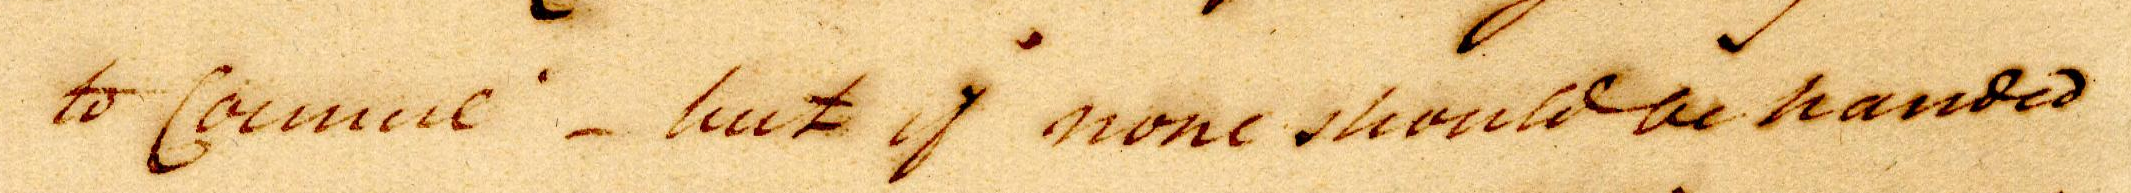to Council, but if none should be handed
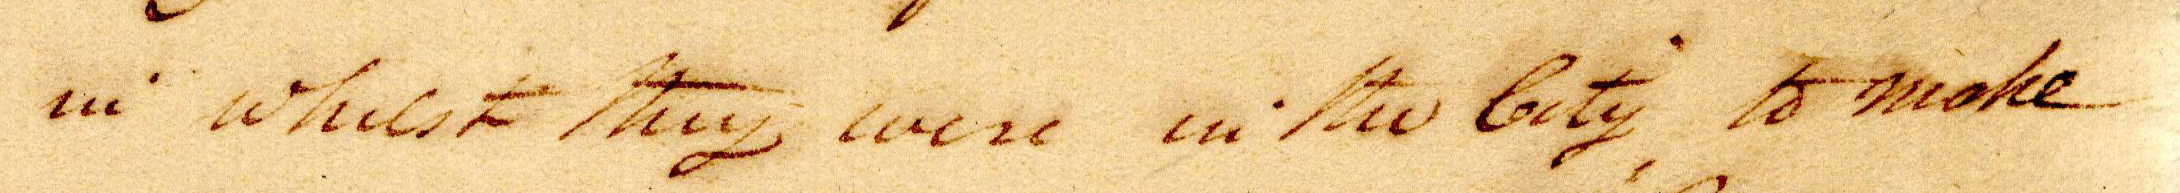in Whilst they, were in the City, to make
